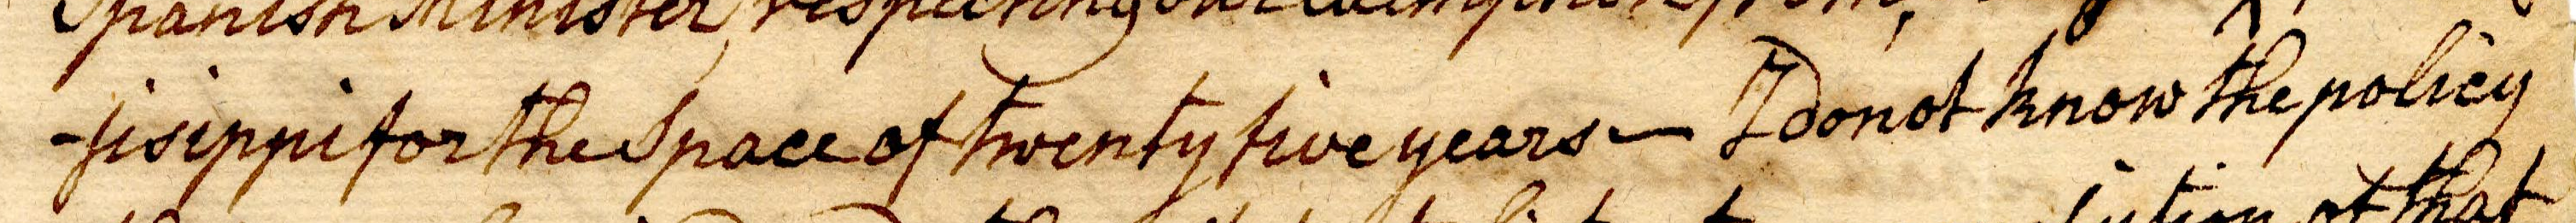-sisippi for the space of twenty five years- I do not know the policy
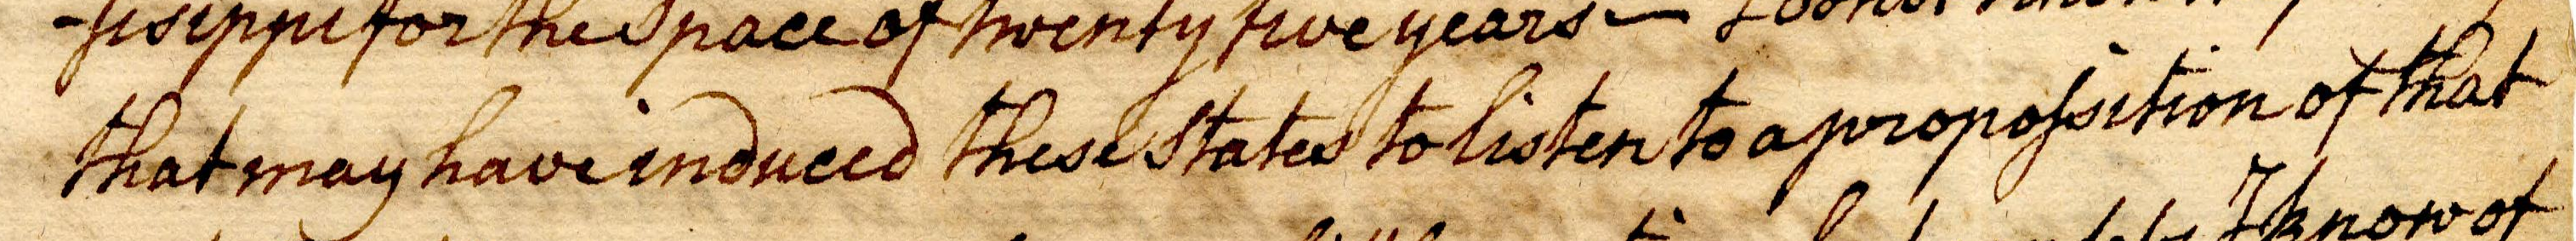that may have induced these states to listen to a propossition of that
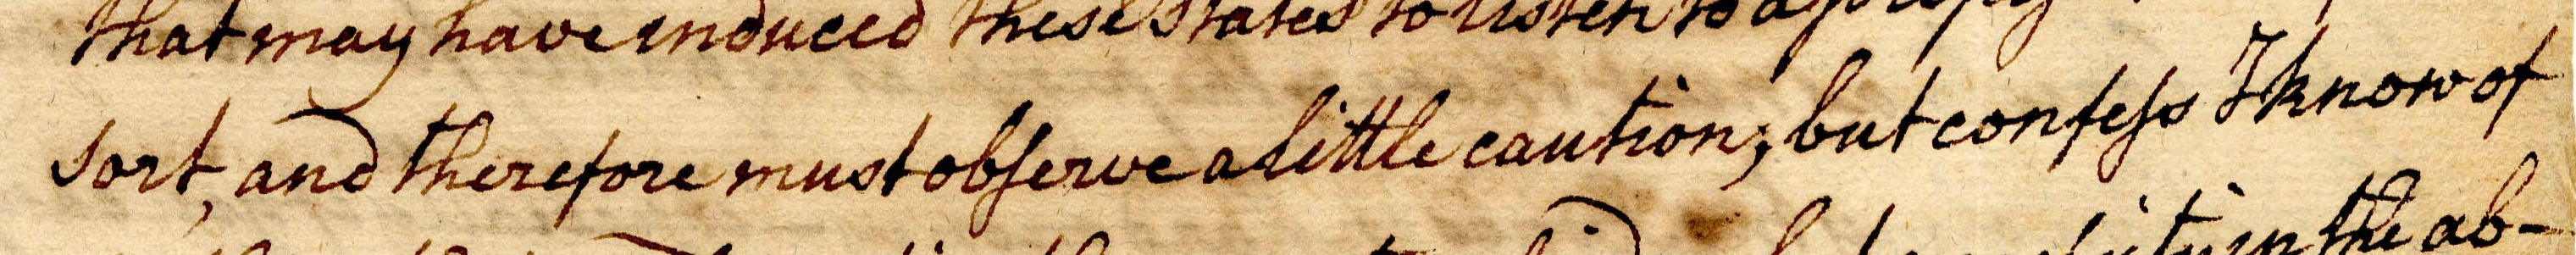sort, and therefore must observe a little caution; but confess I know of
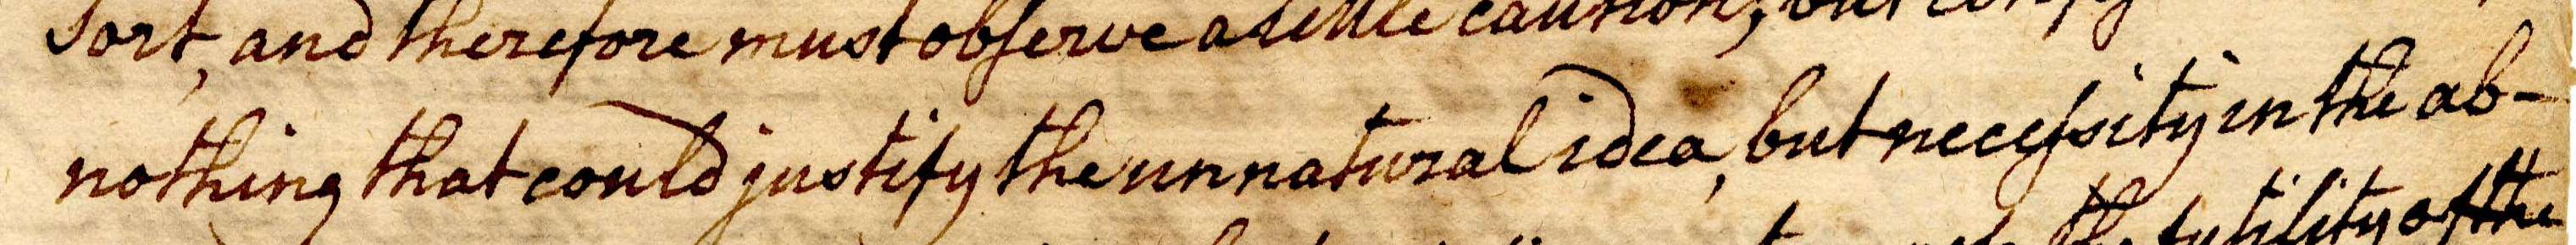nothing that could justify the unnatural idea, but necessity in the ab-
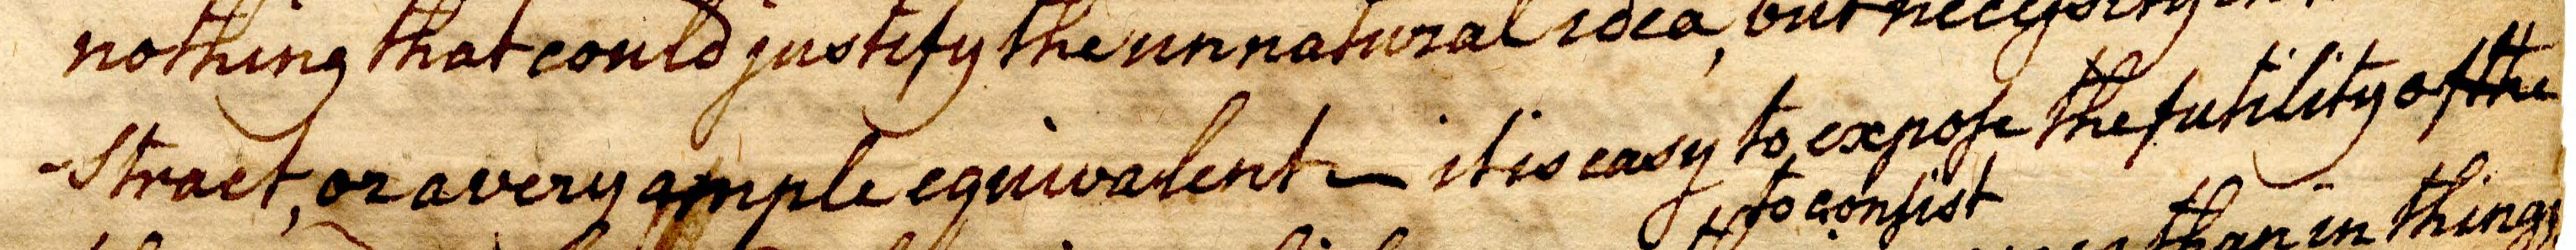-stract, or a very ample equivalent- it is easy to expose the futility of the
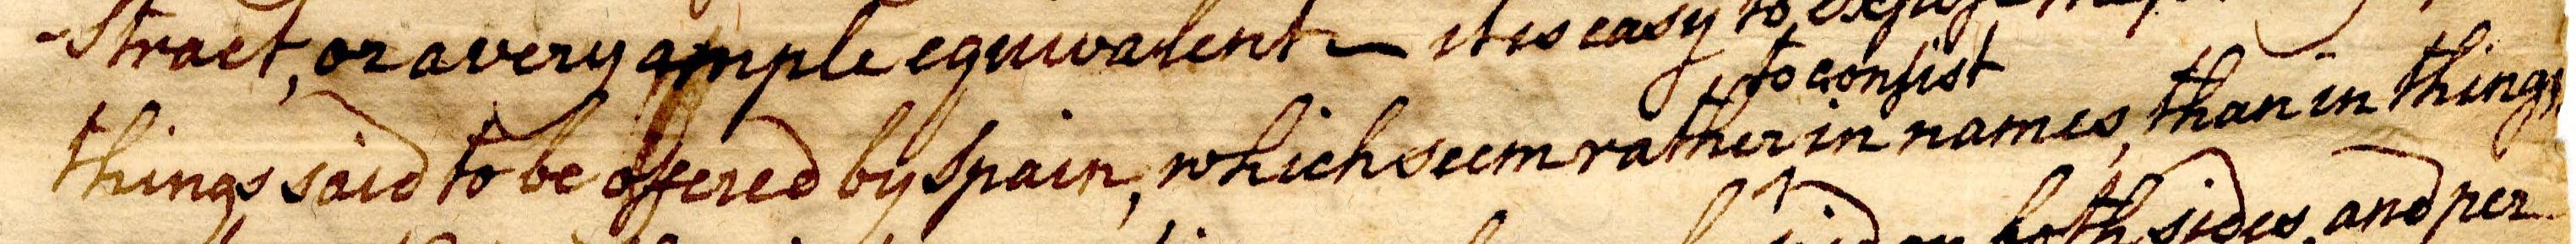things said to be offered by spain, which seem rather ^ in names, than in things,
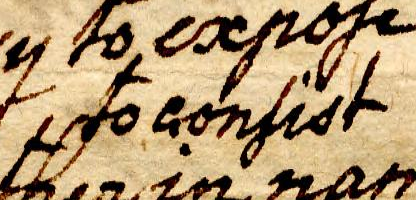to consist
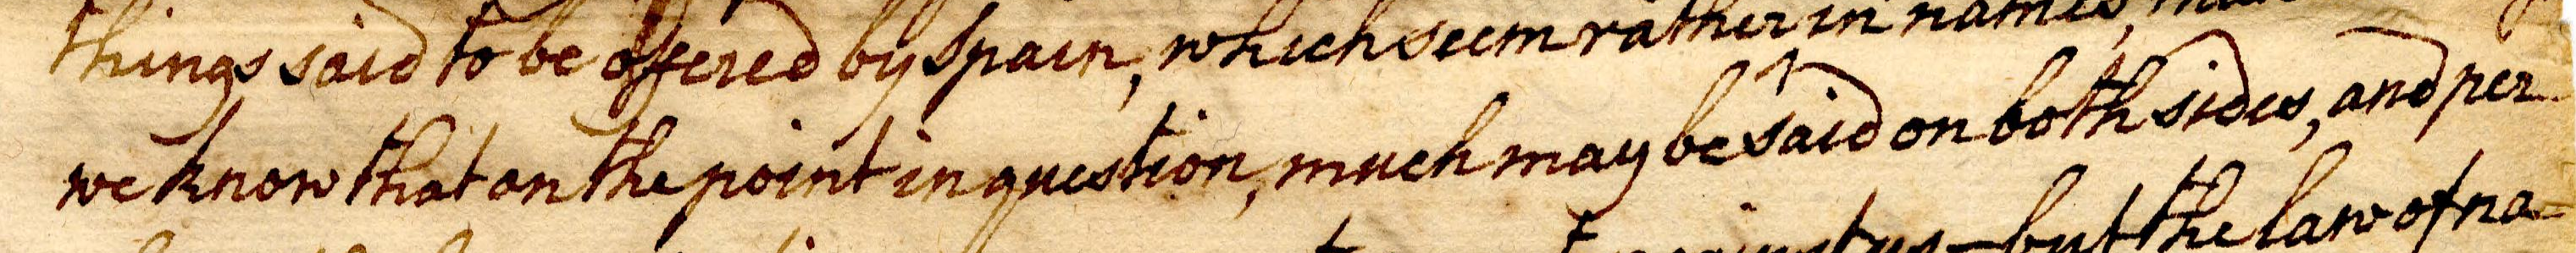we know that on the point in question, much may be said on both sides, and per
